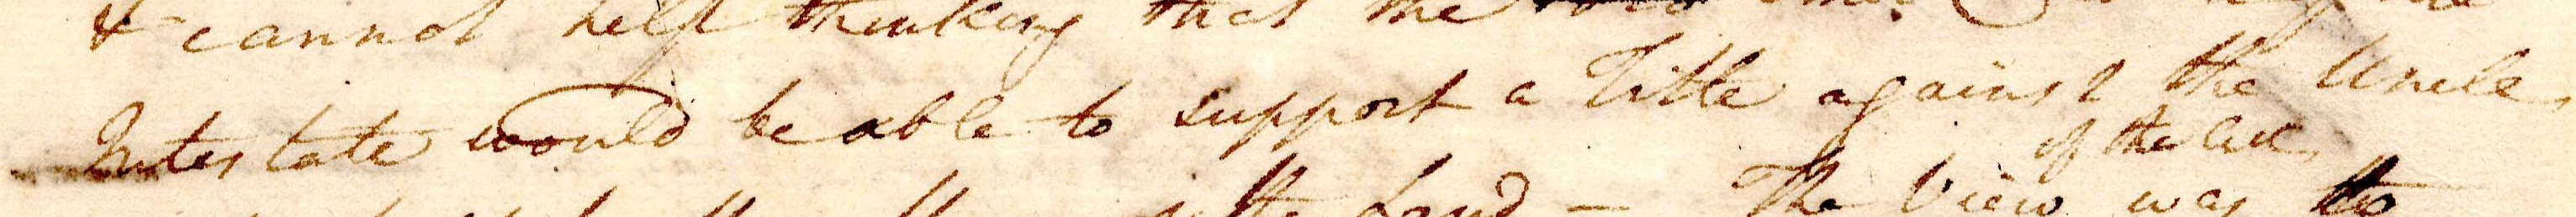Interstate would be able to support a Title against the Uncle
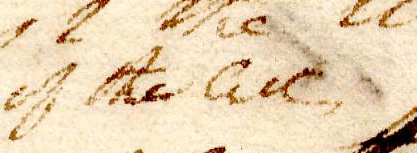of the Act
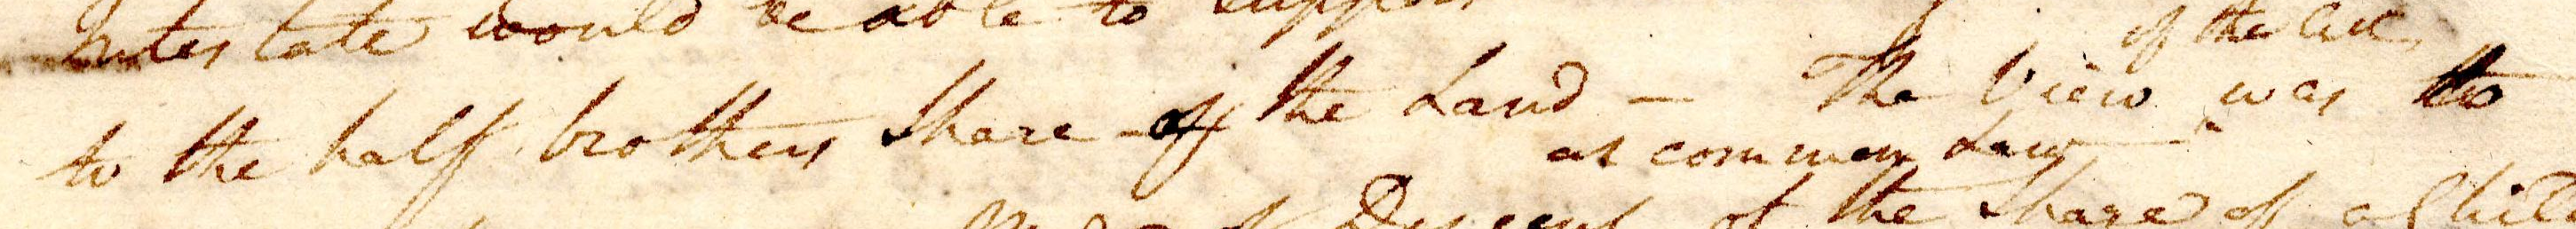to the half brothers Share off the Land- The View ^ was to
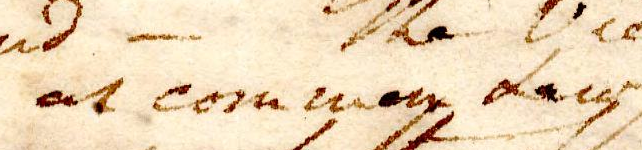as common Law
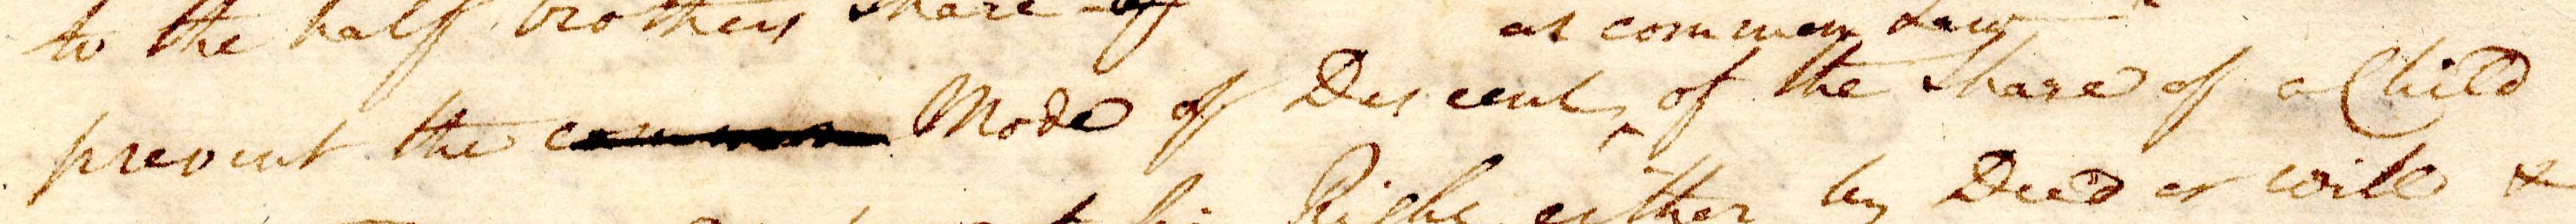prevent the [common] Mode of Descent ^ of the Share of a Child
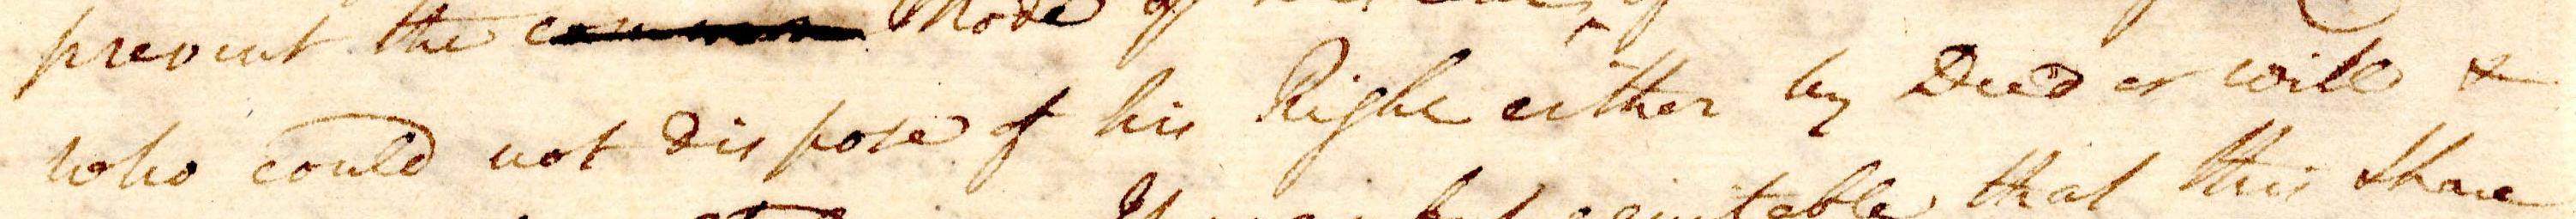who could not dispose of his Right either by Deed or will &
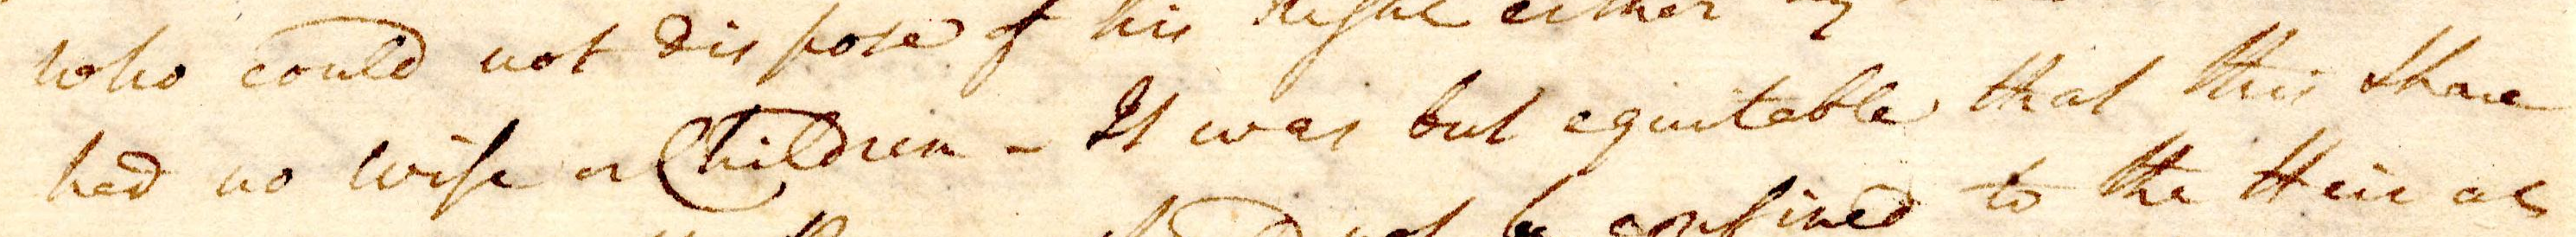had no wife or Children. It was but equitable that this share
